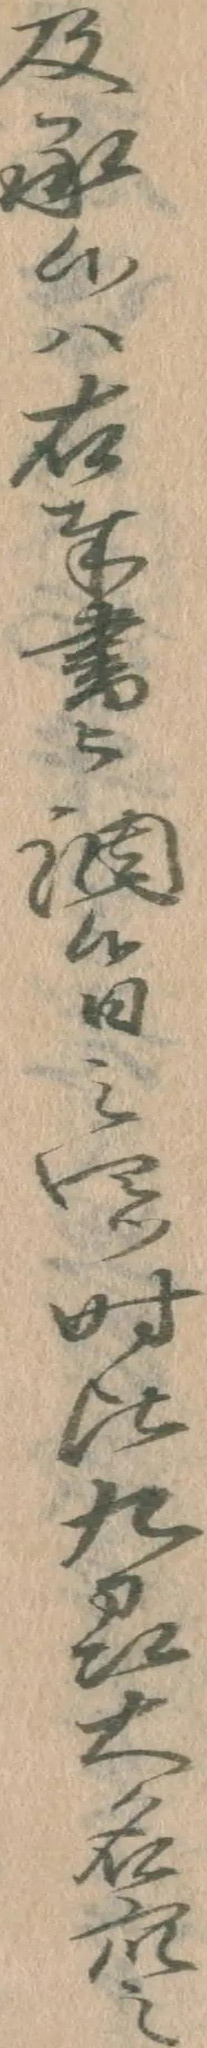及承候は右奉書被調候日之四つ時比九州大名衆之
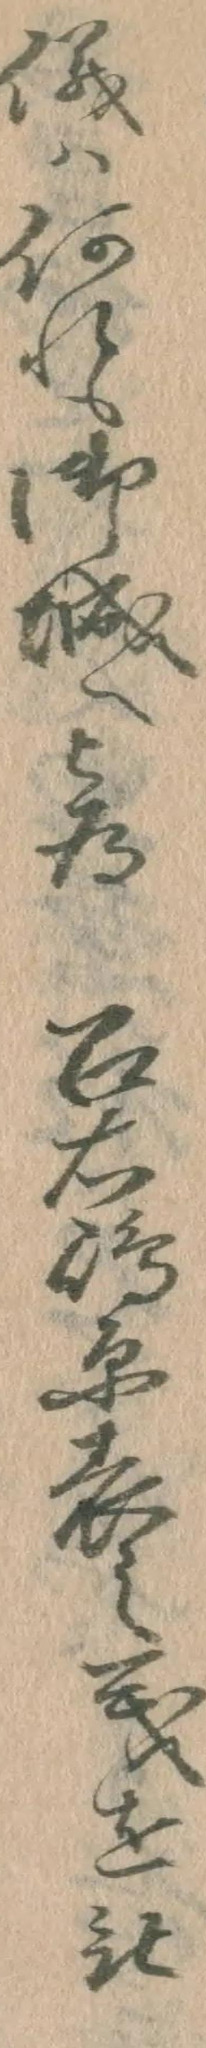儀は何れも御城へ被為召右島原表之義を被
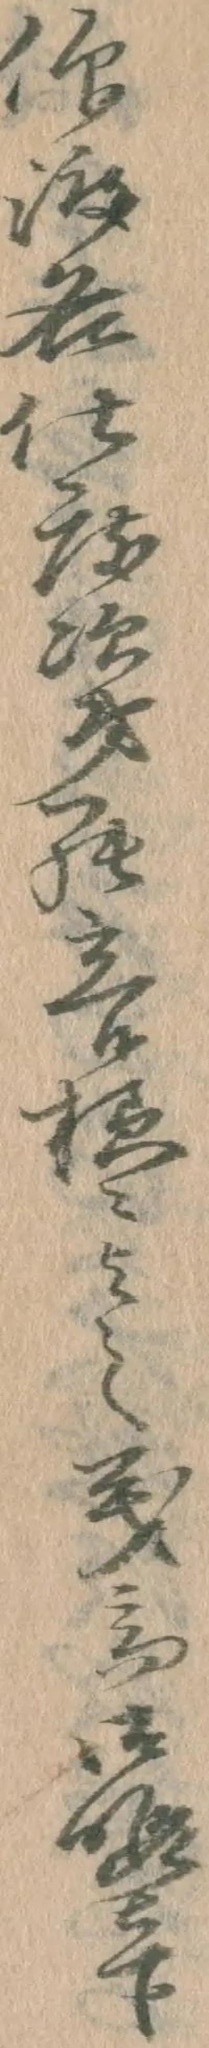仰渡各仕度次第罷立候様に与之義に而御暇被下
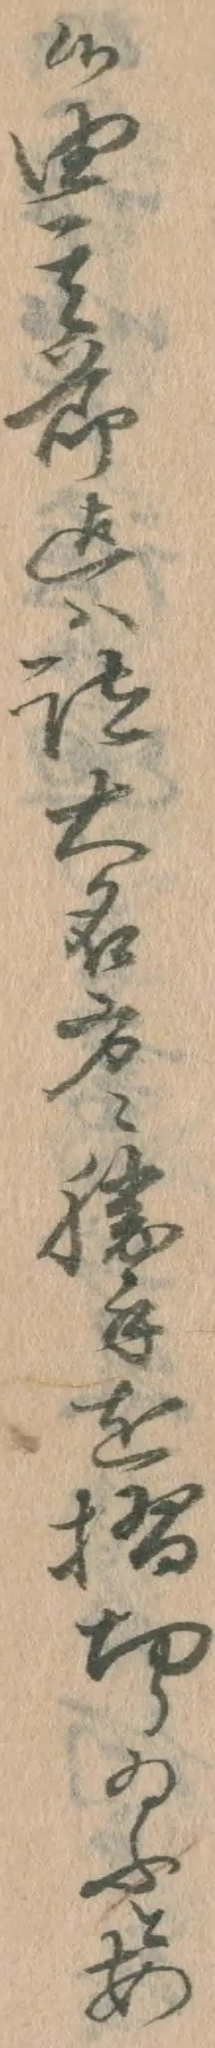候由其節迄は諸大名方に勝手を摺切ゐふとあ
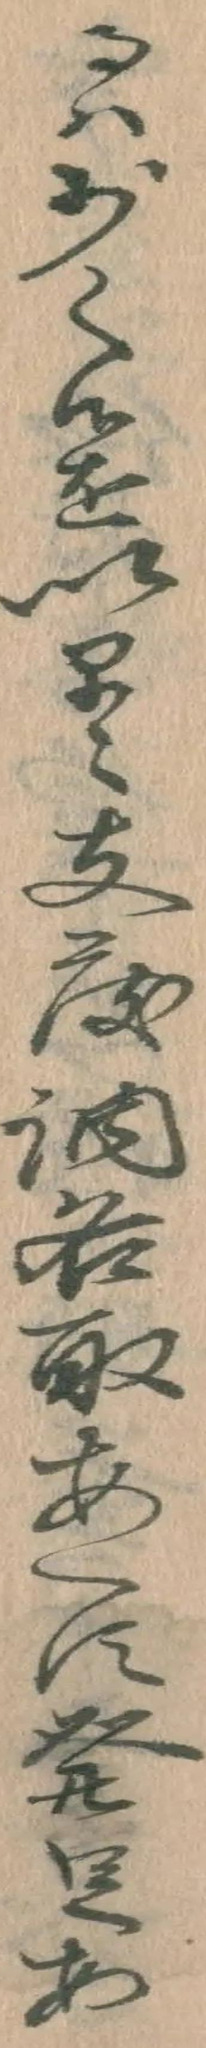るは少く候を以早々支度調各取あへ須発足あ
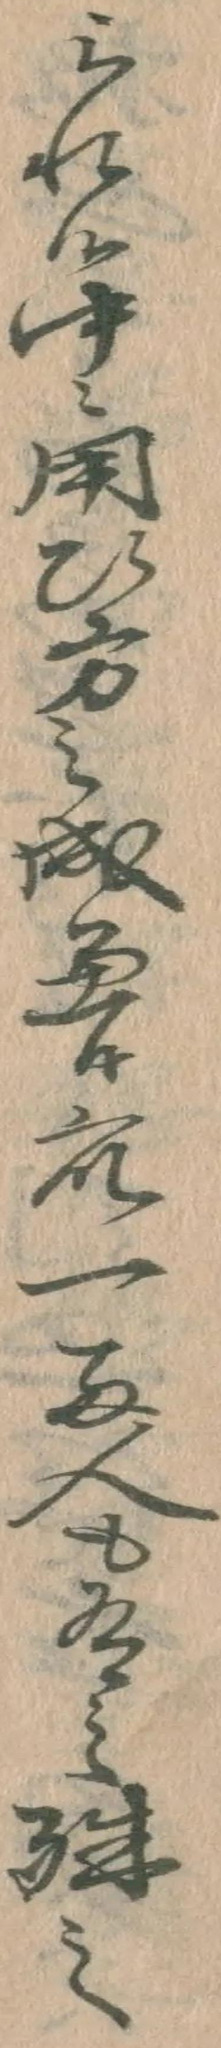られ候中々用ひ方之成兼候衆一両人も有之殊之
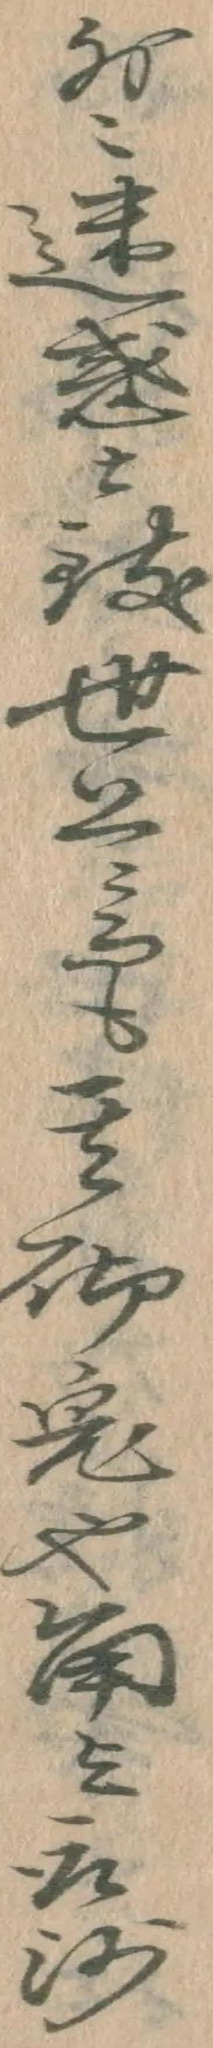外に迷惑被致世上に而も其砌兎や角与取沙
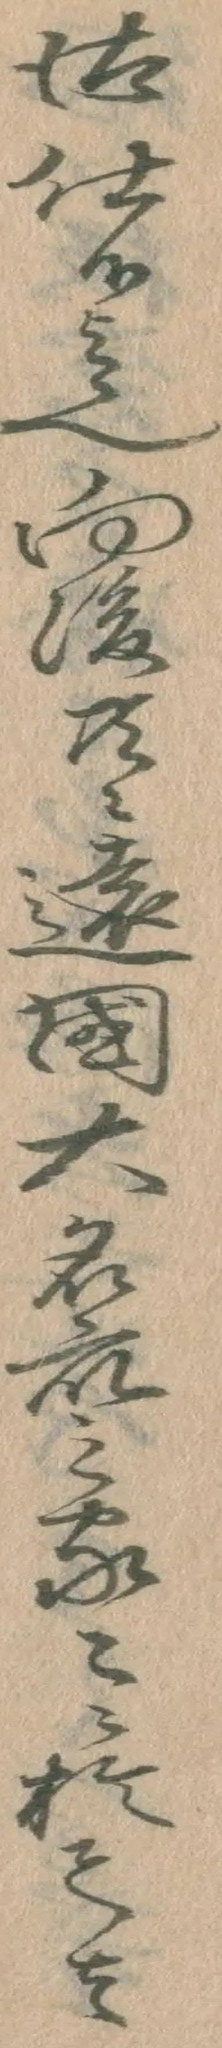汰仕候与也向後共に遠国大名衆之家々に於て者
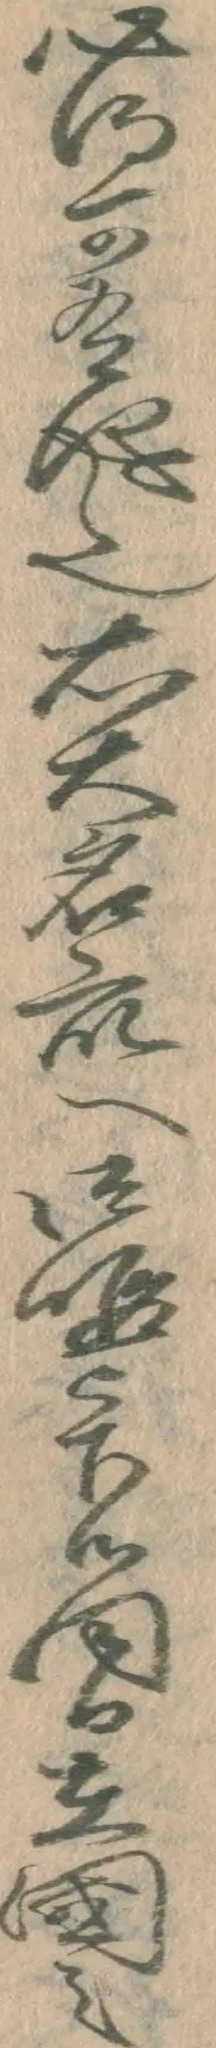心得可有儀也右大名衆へ御暇被下候同日在国之
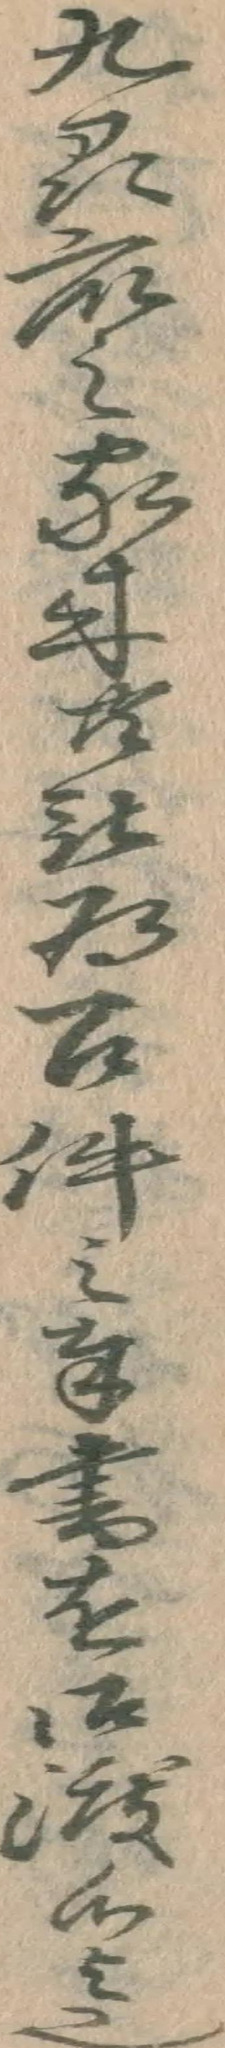九州衆之家来共被為召件之奉書を御渡候与也
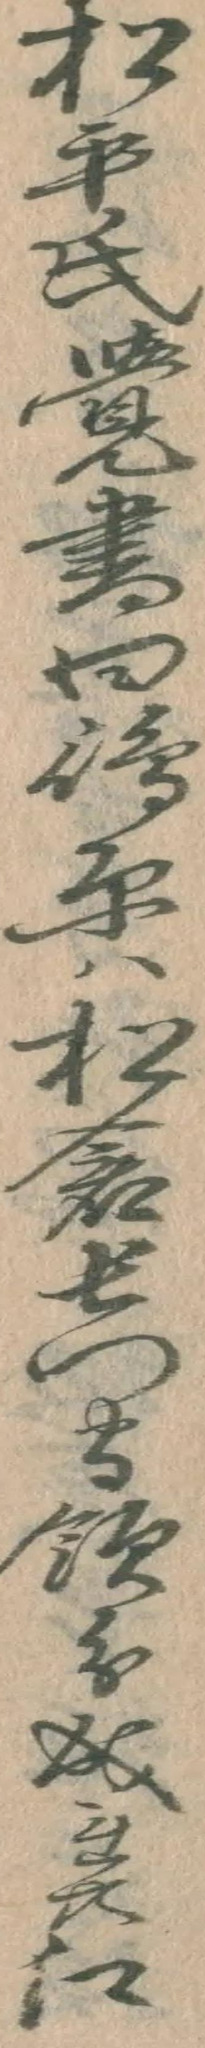松平氏覚書曰島原は松倉長門守領分成連共江
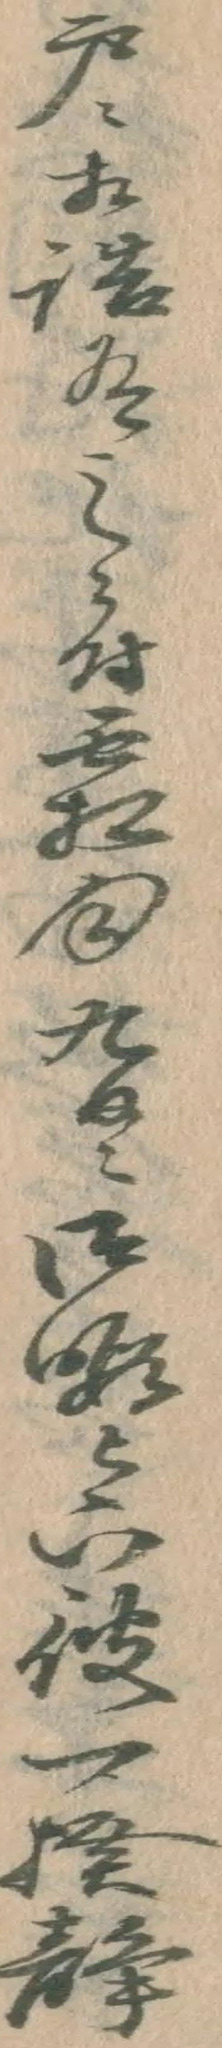戸に相詰有之に付霜月九日御暇被下彼一揆静
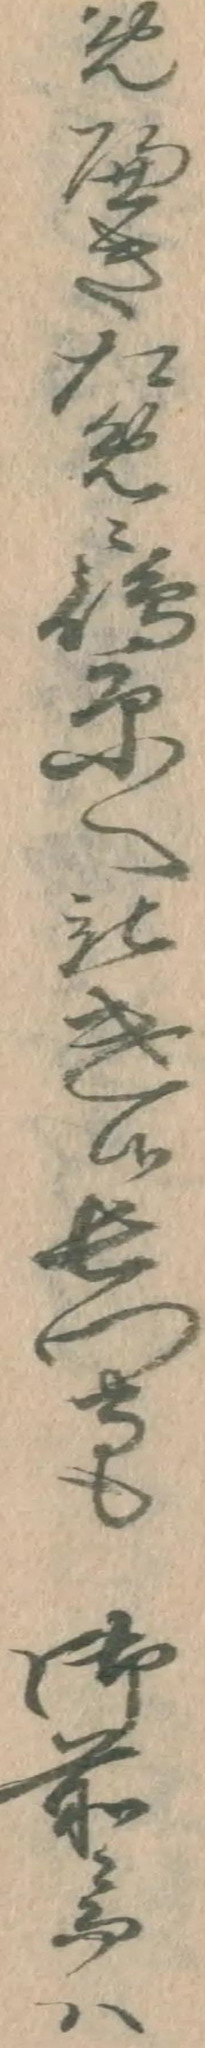免扁きた免に島原へ被遣候長門守も御前に而は
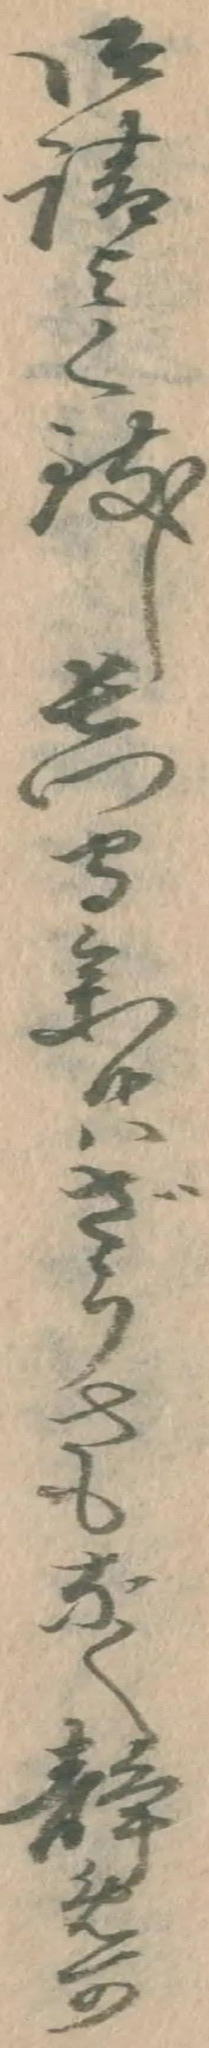御請与く致し長門守参候はざりさもなく静免可

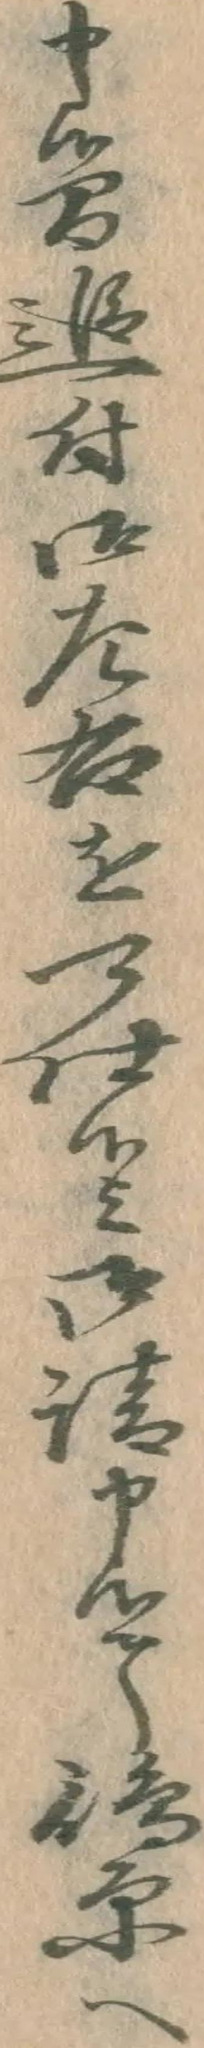申候間追付御左右を可仕候与御請申候て島原へ
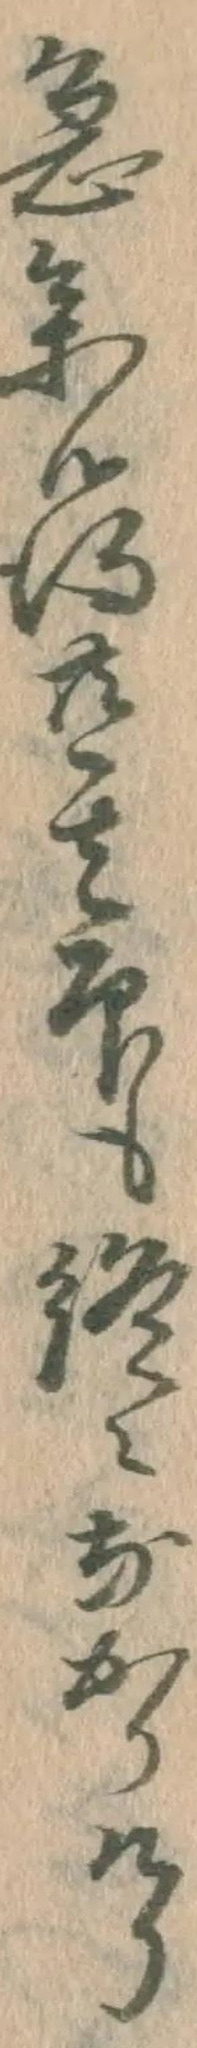急参候得共其印も終になかりけり
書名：切支丹御退治記 49巻. [2]
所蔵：国立国会図書館 National Diet Library, JAPAN
